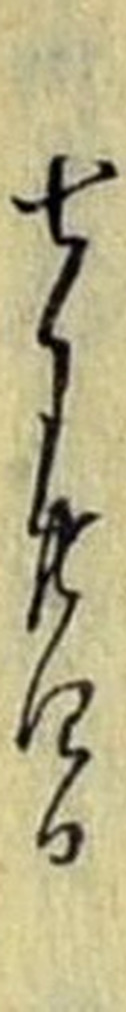七月十三日

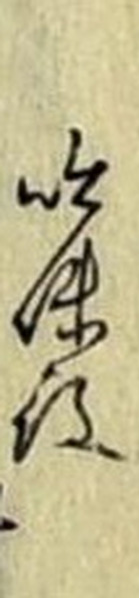吟味役
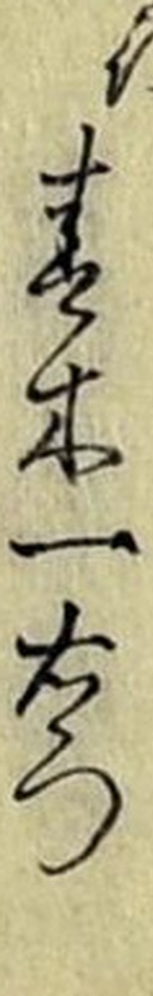青木一右衛門
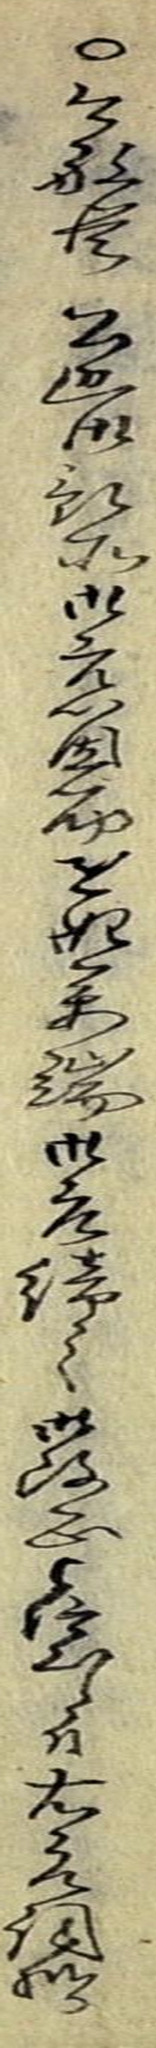○今般従公辺御預所御取箇筋を始万端御取締之御改正被仰出候に付右取調掛り
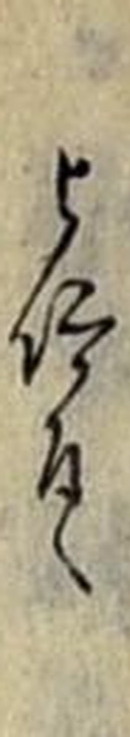被仰付候
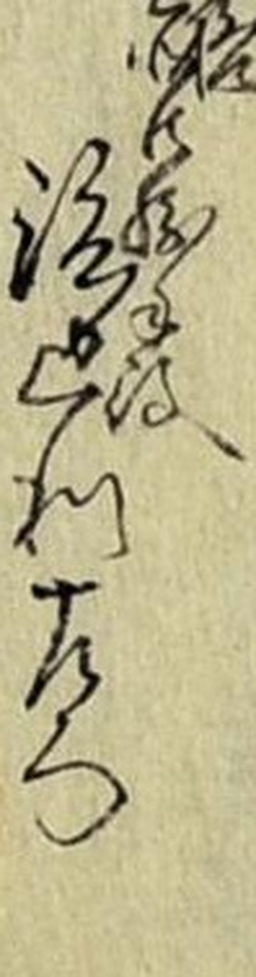渡辺利左衛門
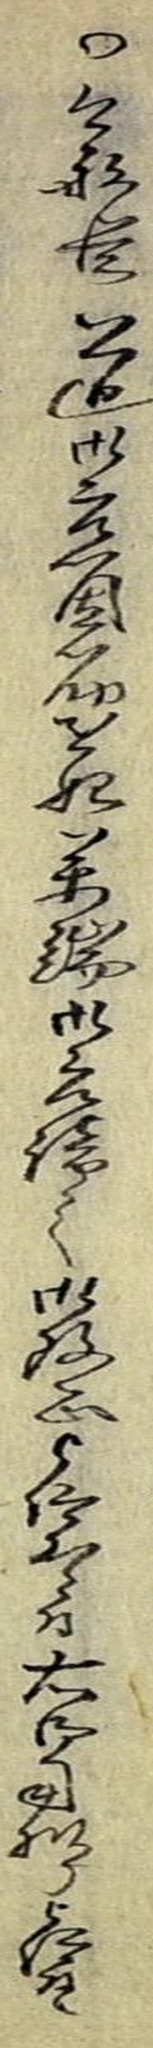○今般従公辺御預所御取箇筋を始万端御取締之御改正被仰出候に付右御用掛り被仰付候
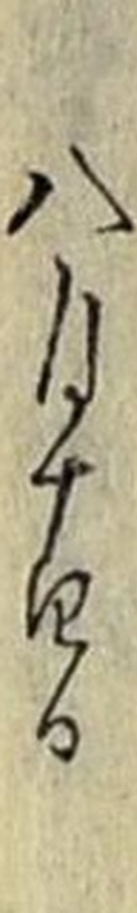八月十四日
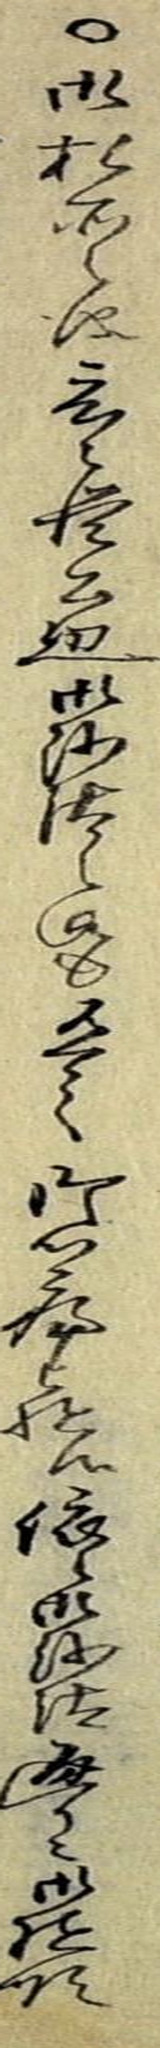○御札所之儀度々従公辺御沙汰之趣も有之御心痛被遊候依之御沙汰通りに御従順
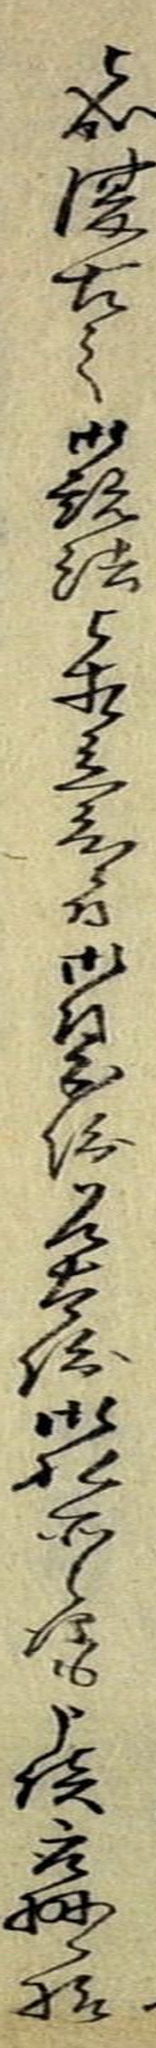被成復古之御趣法被相立度に付御自分儀乍太儀御札所之儀も申談取扱候様
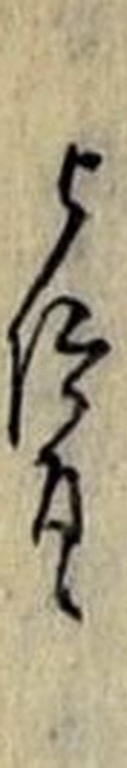被仰付候
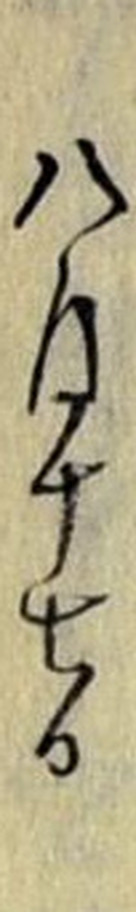八月十七日
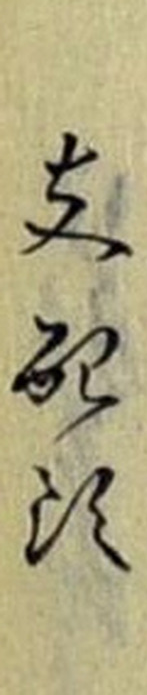支配頭
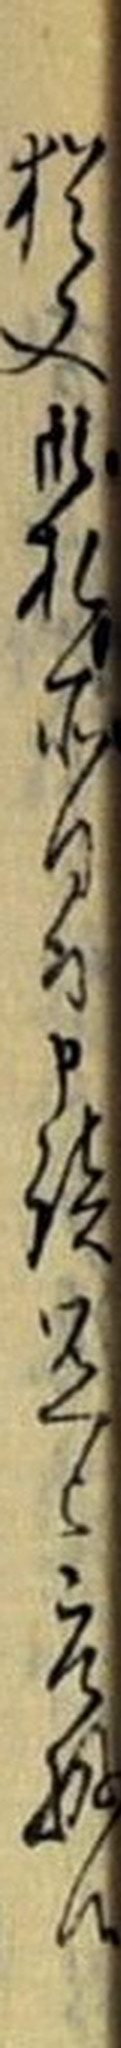猶又御札所目付申談宜取扱候
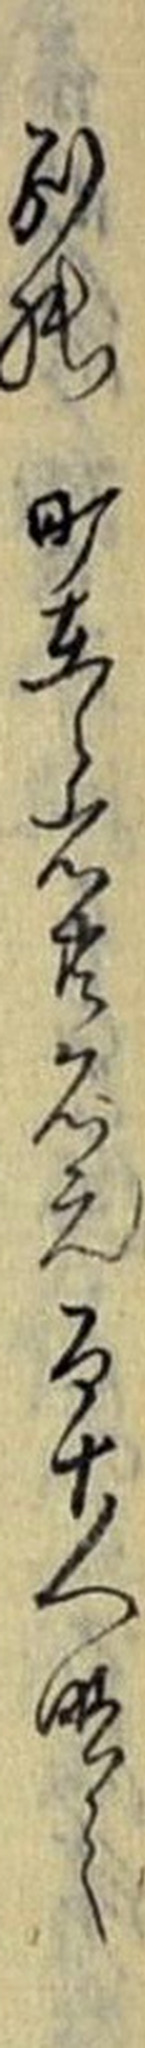別紙町在之者共名元百十人略之
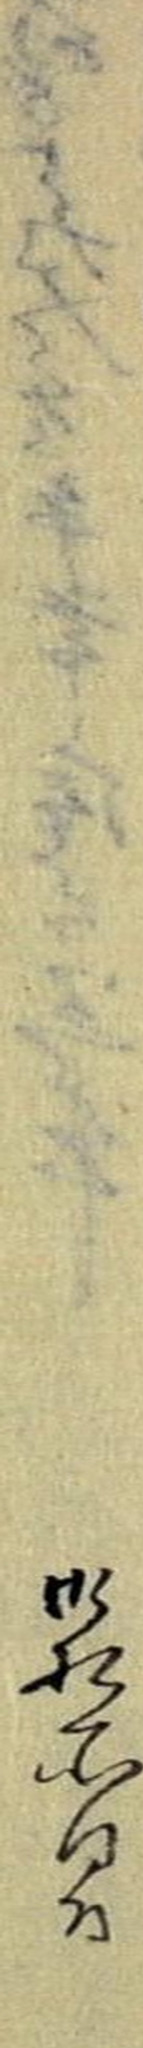御札所目付
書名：命令之部 六
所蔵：福井県文書館 Fukui Prefectural Archives
